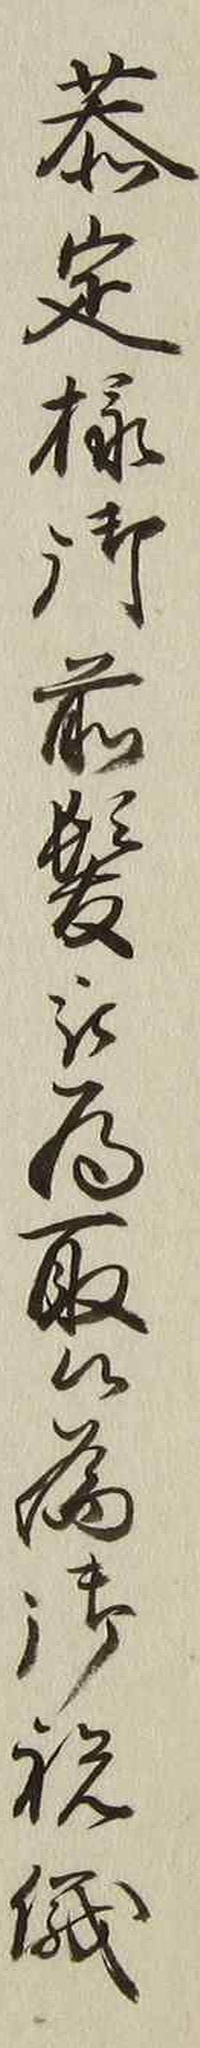恭定様御前髪被為取候為御祝儀
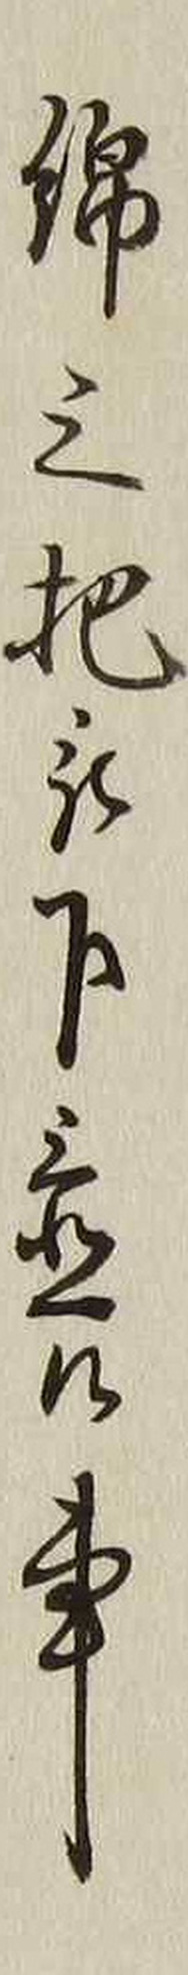綿三把被下置候事
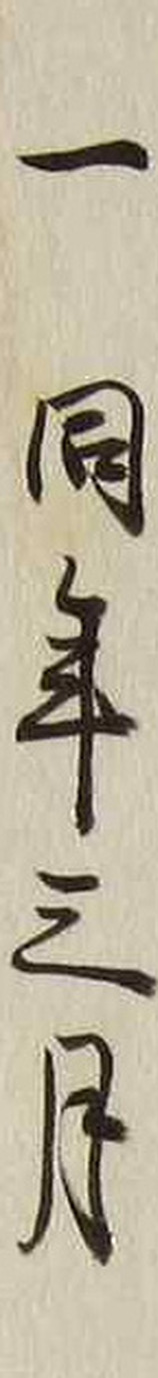一同年三月
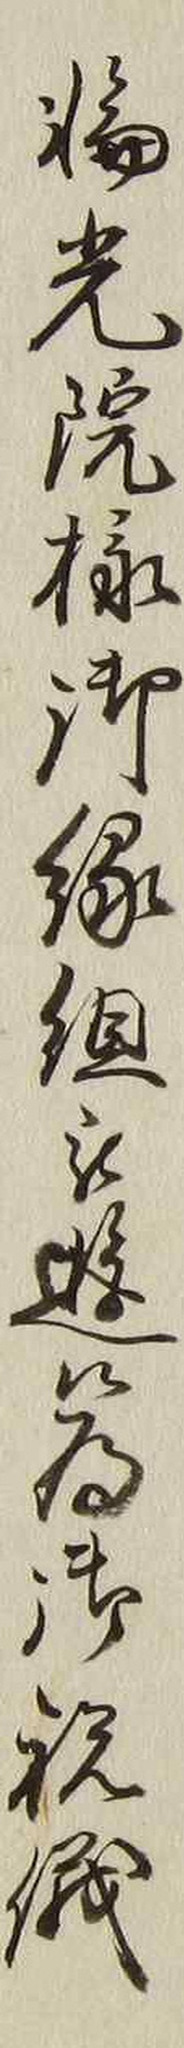輪光院様御縁組被遊候為御祝儀
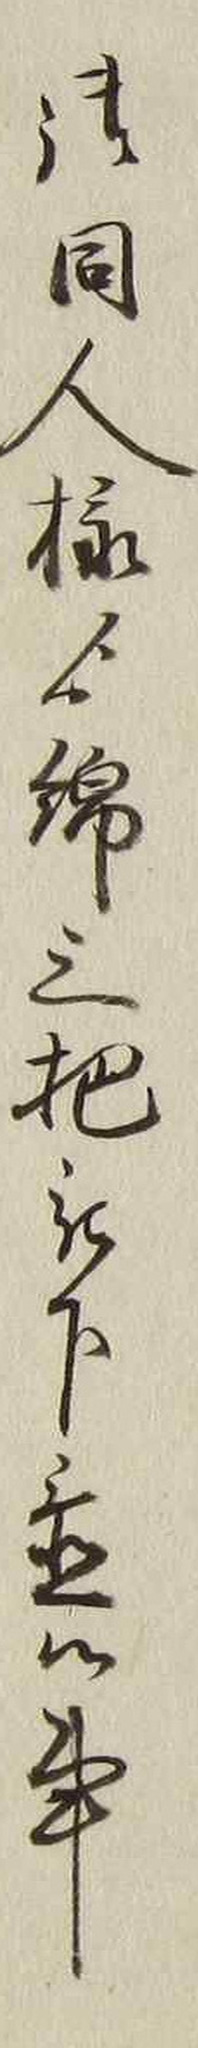御同人様ゟ綿三把被下置候事
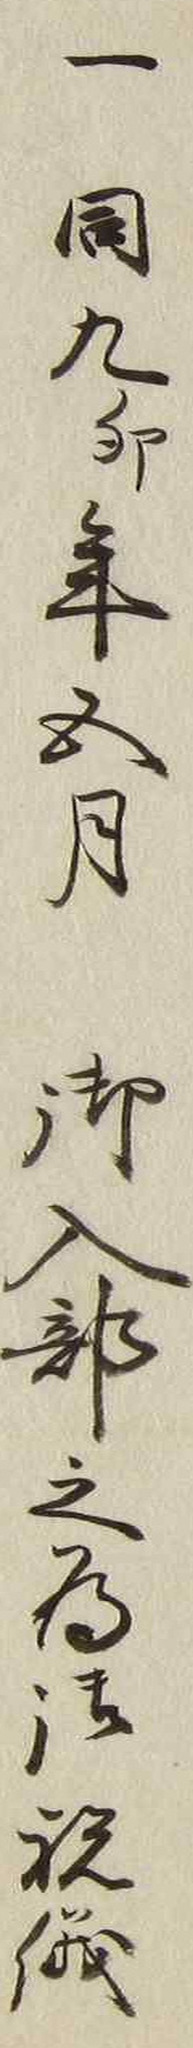一同九卯年五月御入部之為御祝儀
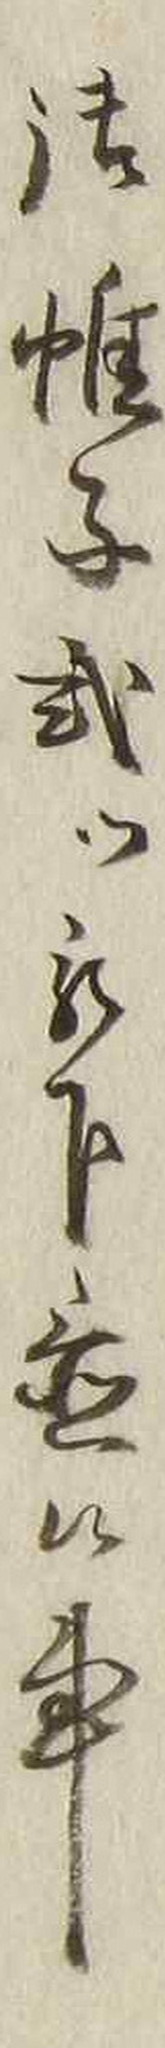御帷子弐ツ被下置候事

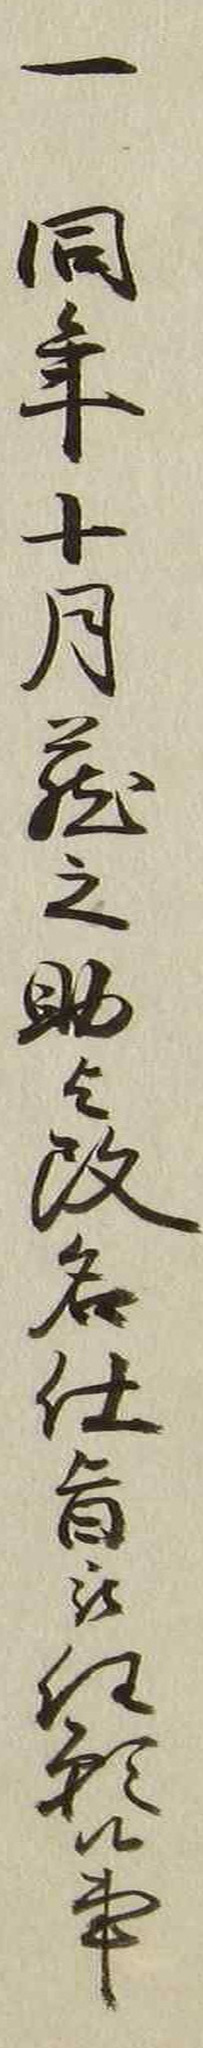一同年十月蔵之助与改名仕旨被任願候事
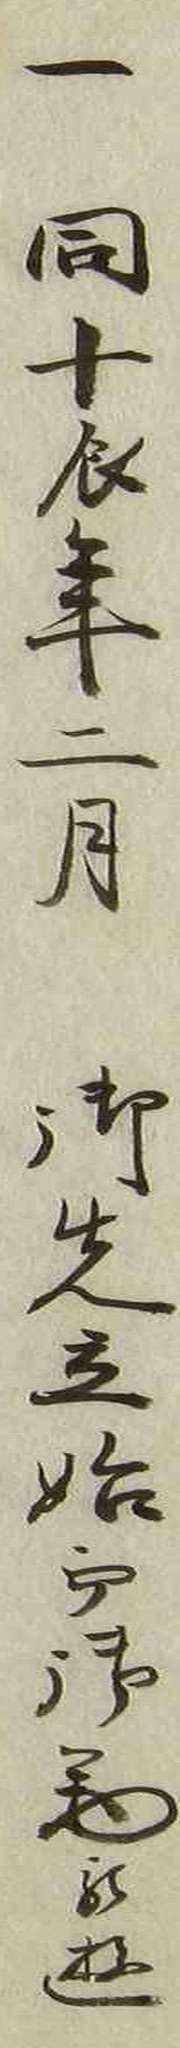一同十辰年二月御先立始而御勤被遊
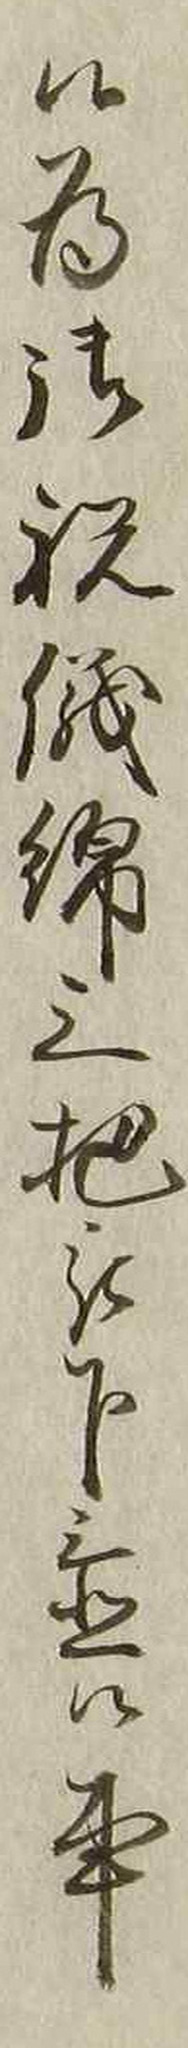候為御祝儀綿三杷被下置候事
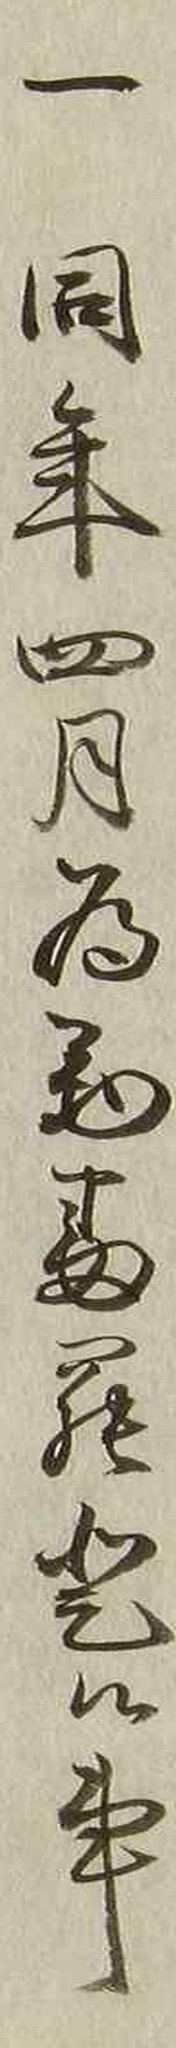一同年四月為勤番罷登候事
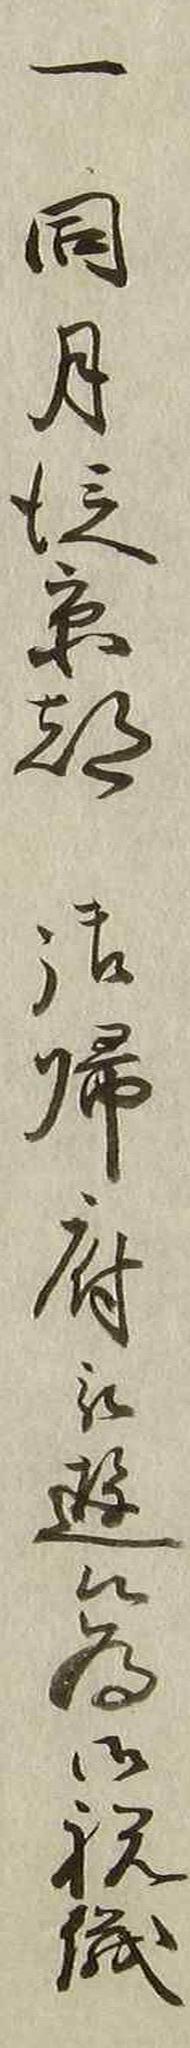一同月従京都御帰府被遊候為御祝儀
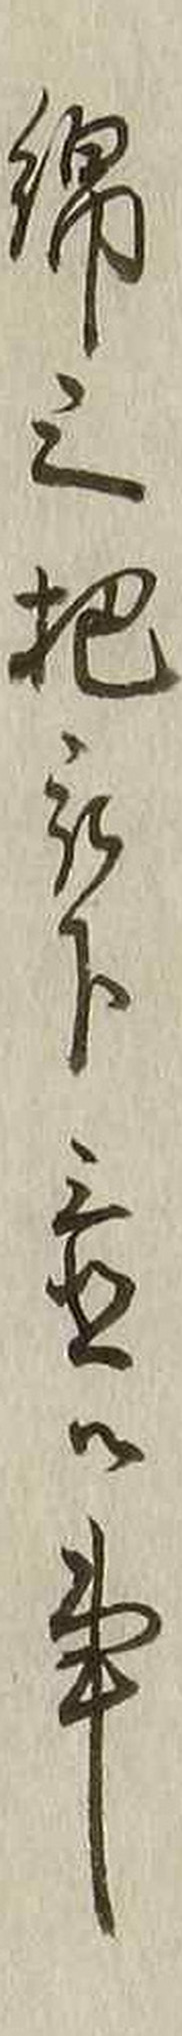綿三把被下置候事
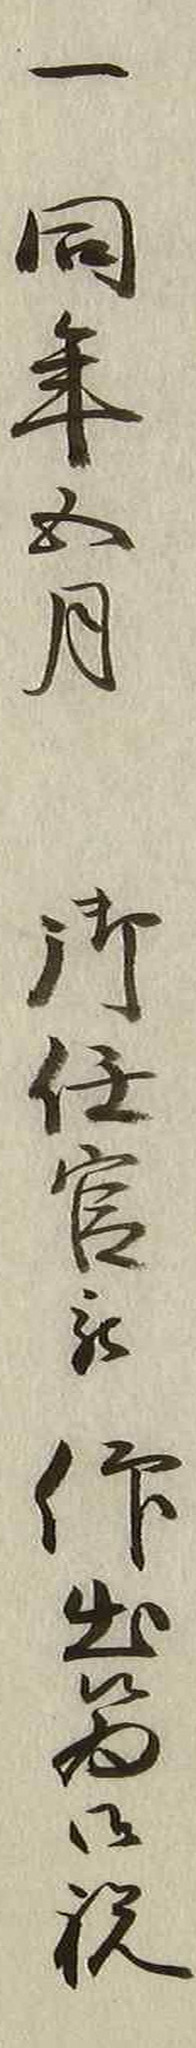一同年五月御任官被仰出候為御祝
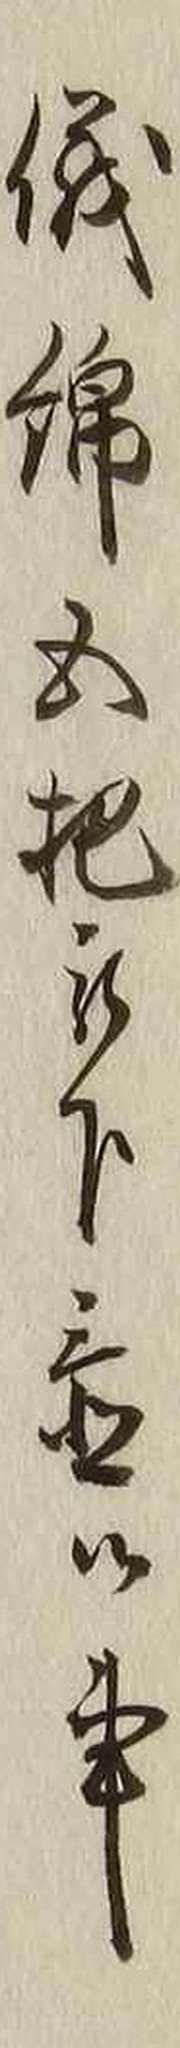儀綿五把被下置候事
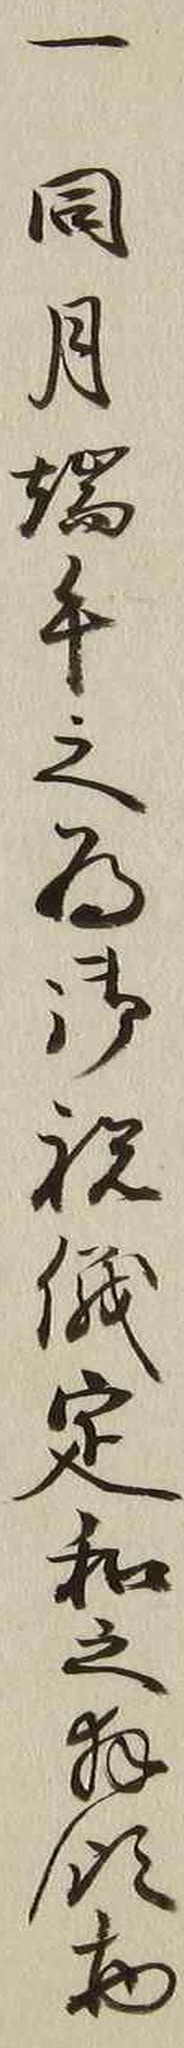一同月端午之為御祝儀定和之拝領物
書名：諸士系譜　巻之15　い之部15
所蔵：会津若松市立会津図書館
